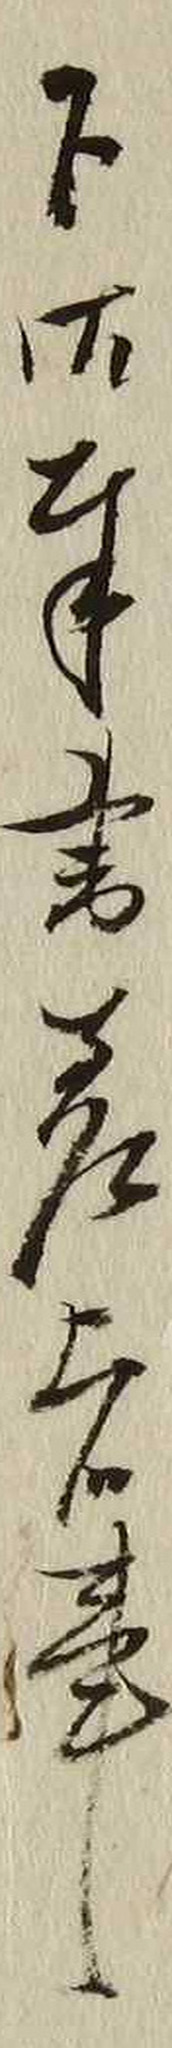下御奉書差上候事
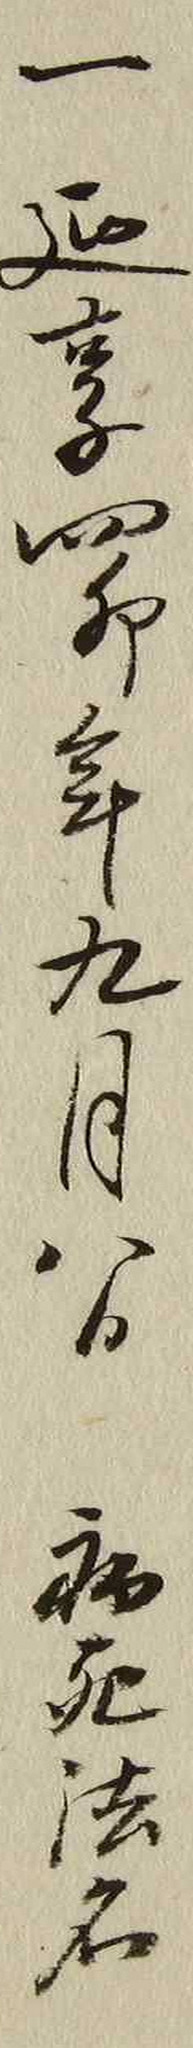一延享四卯年九月八日病死法名
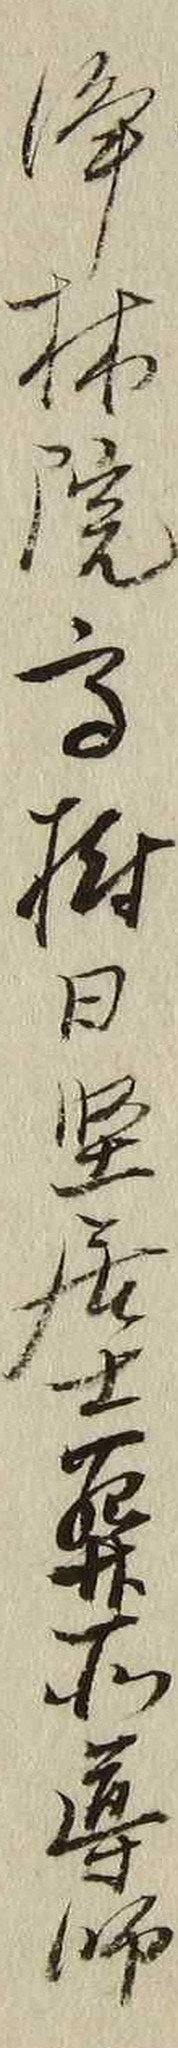浄林院高樹日堅居士葬所導師
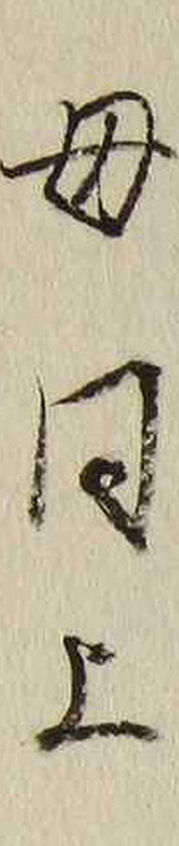母同上

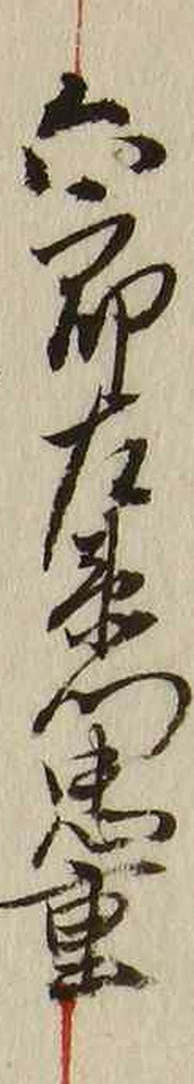六郎左衛門忠重
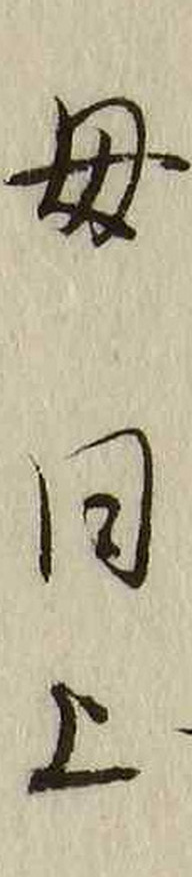母同上
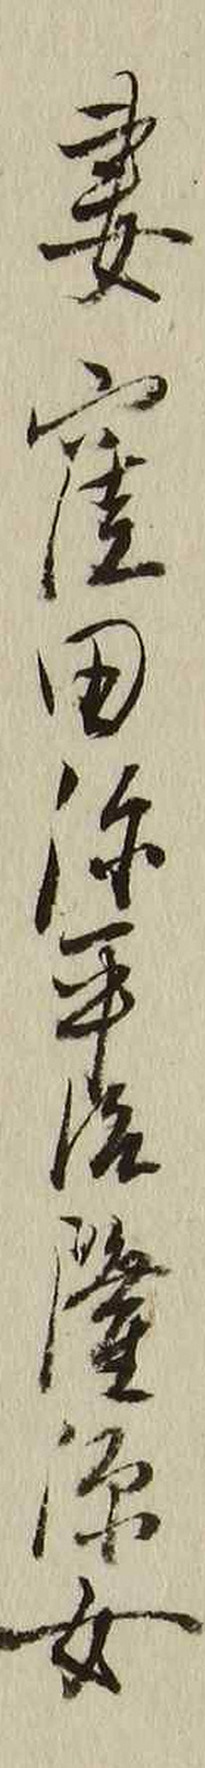妻窪田弥平治隆源女
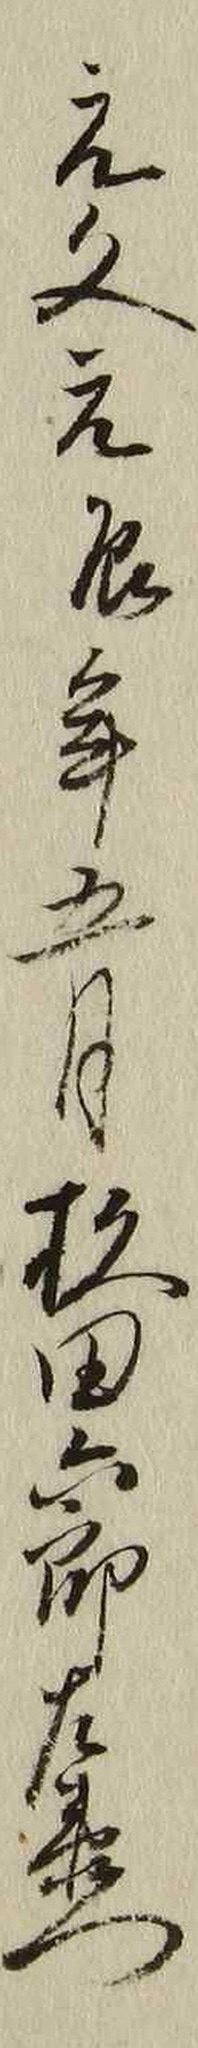元文元辰年五月杉田六郎左衛門
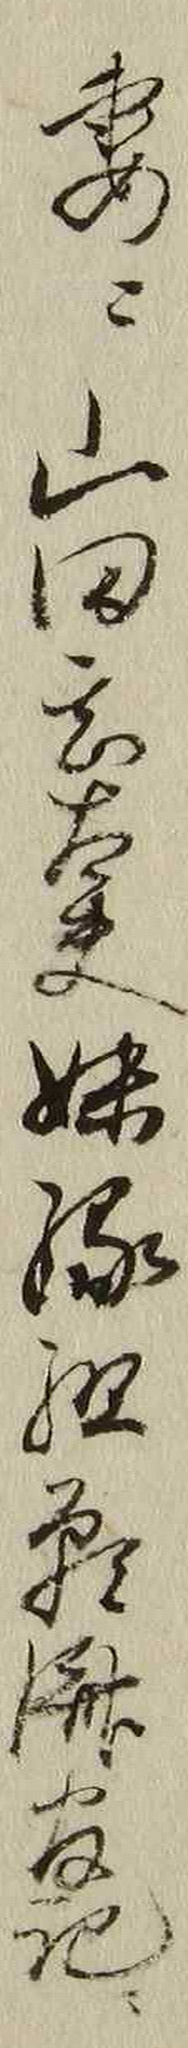妻ニ山田甚太夫妹縁組願済官記ニ
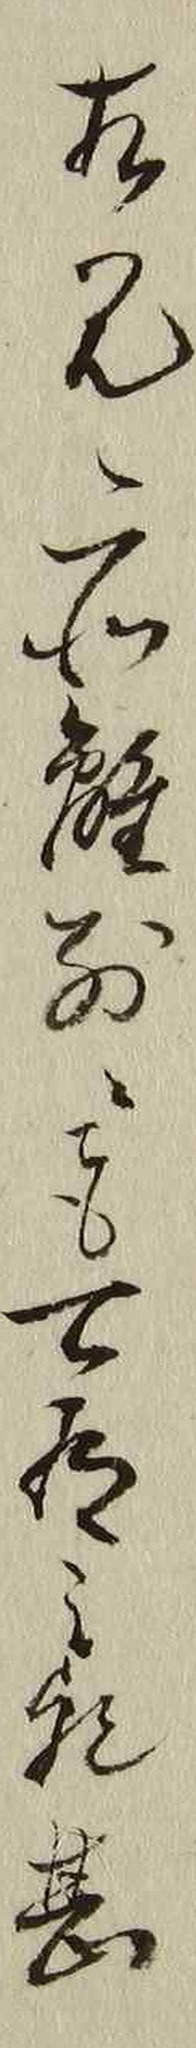相見候所離別ニても可有之か甚
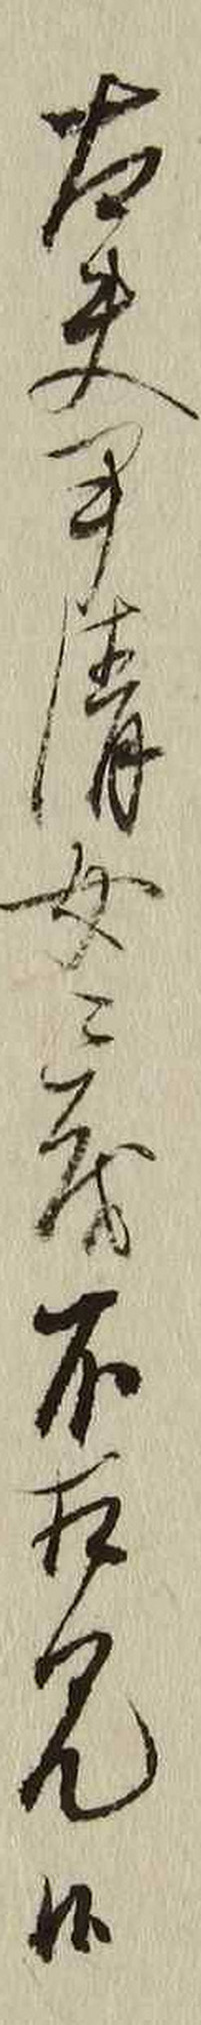太夫尹清女ニ茂不相見候
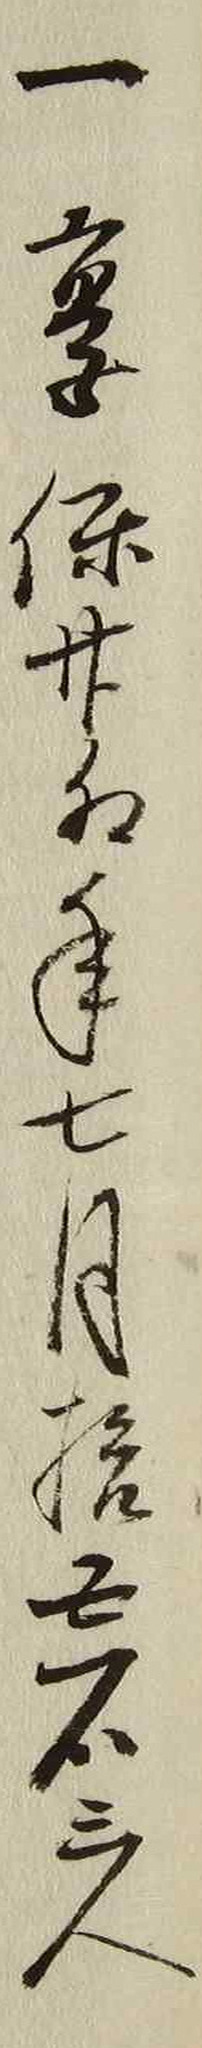一享保廿卯年七月拾五石三人
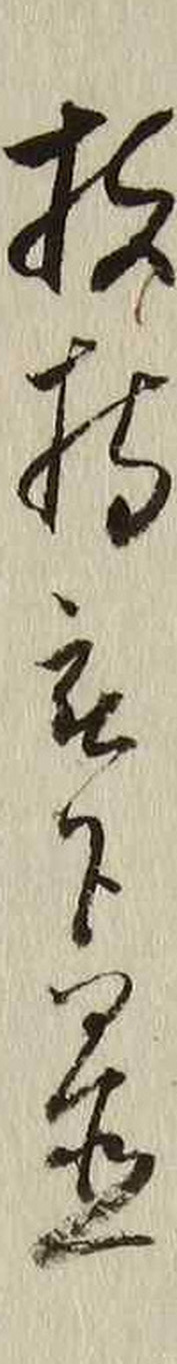扶持被下置
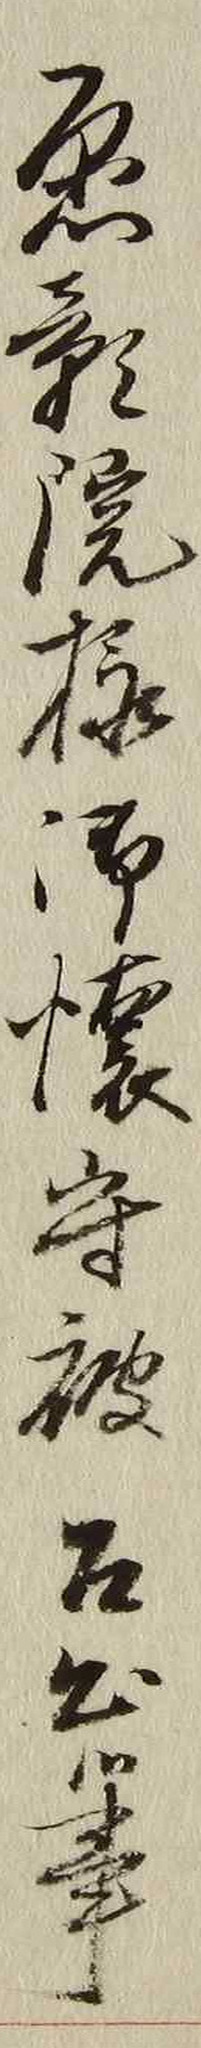愿彰院様御懐守被召出候事
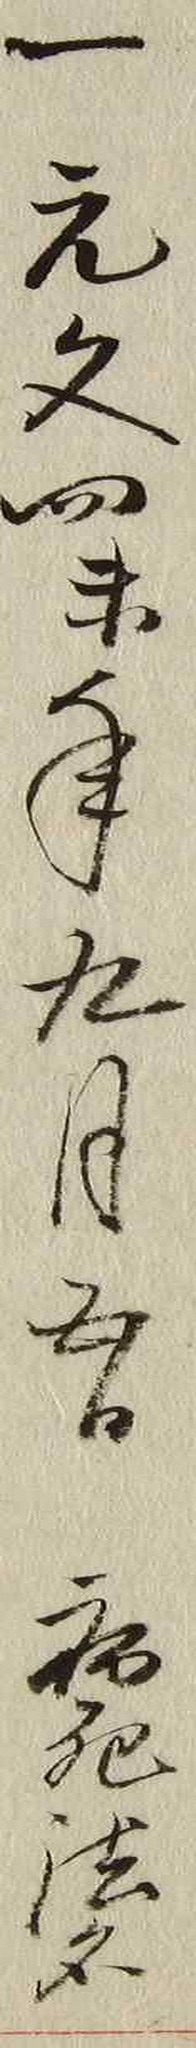一元文四未年九月五日病死法名
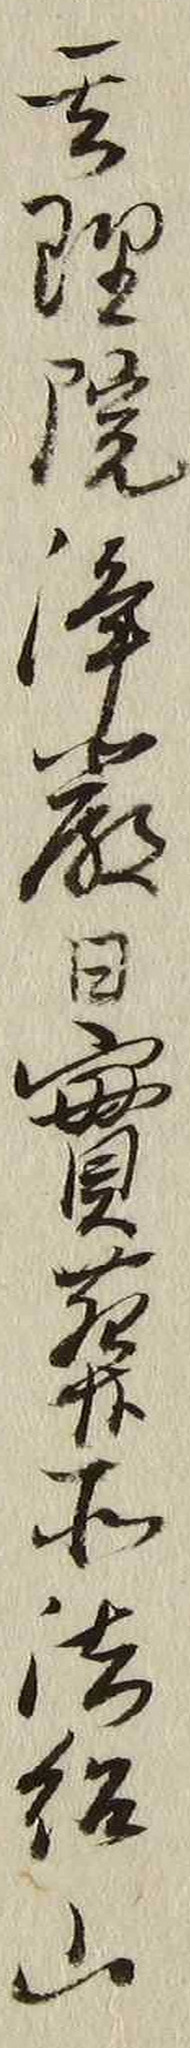玄理院浄厳日実葬所法紹山
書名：諸士系譜　巻之351　す之部1
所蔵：会津若松市立会津図書館
